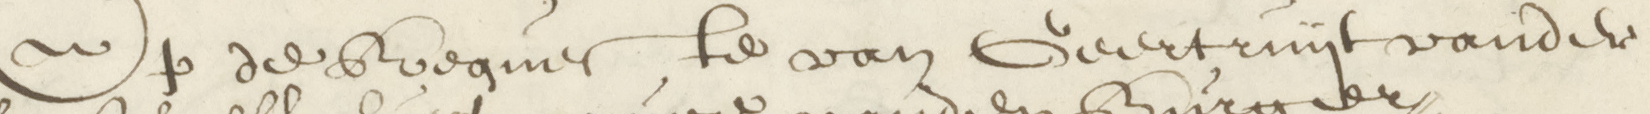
Op de Requeste van Geertruijt vander
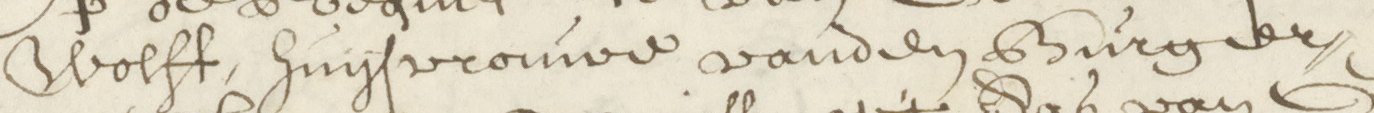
Wolff, huijsvrouwe vanden Burger„
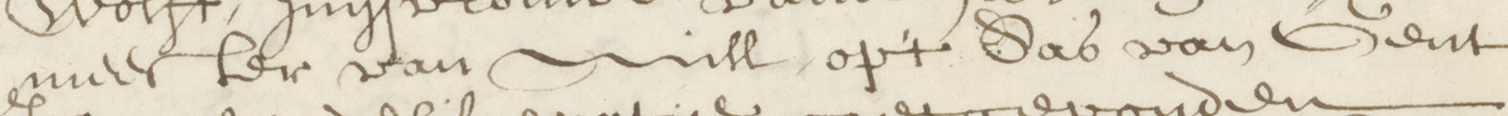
meester van Mill op‛t Sas van Gent,
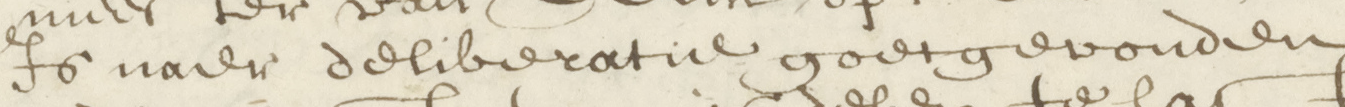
Is naer deliberatie goetgevonden
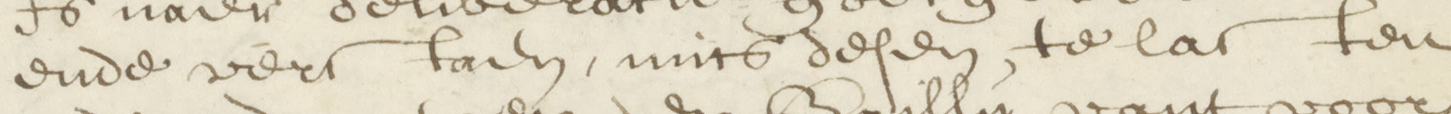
ende verstaen, mits desen te lasten
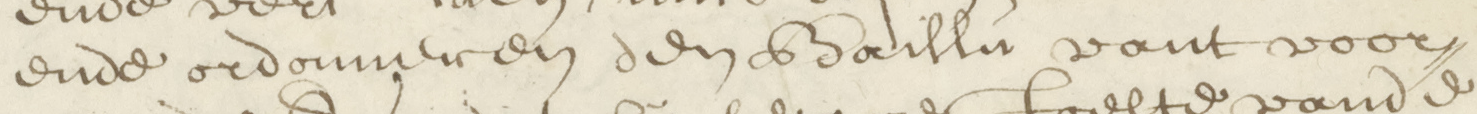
ende ordonneren den Baillu vant voor„
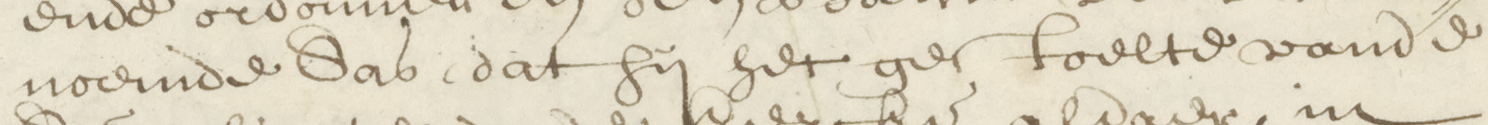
noemde Sas, dat hij het gestoelte vande
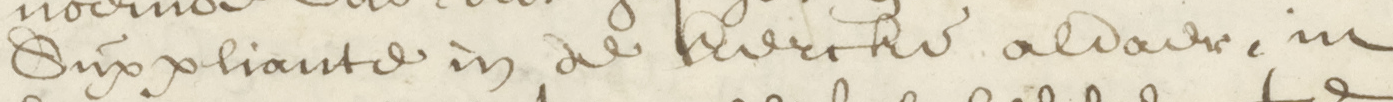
Suppliante in de kercke aldaer, in
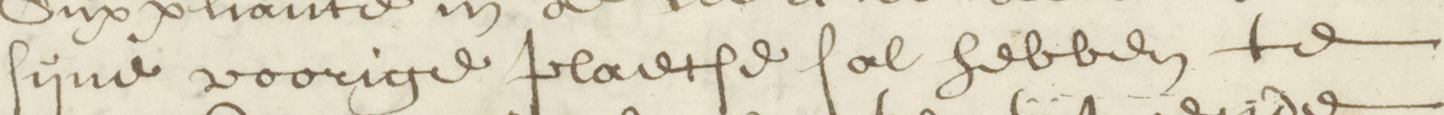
sijne voorige plaetse sal hebben te
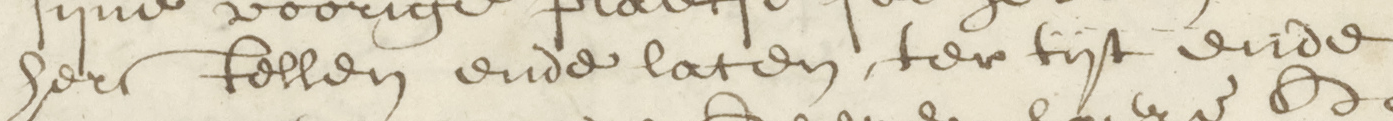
herstellen ende laten, ter tijt ende
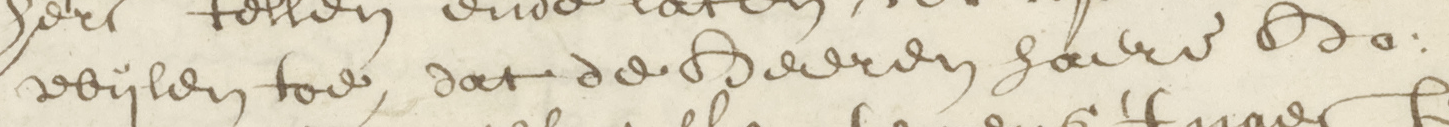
wijlen toe, dat de Heeren haere Ho:
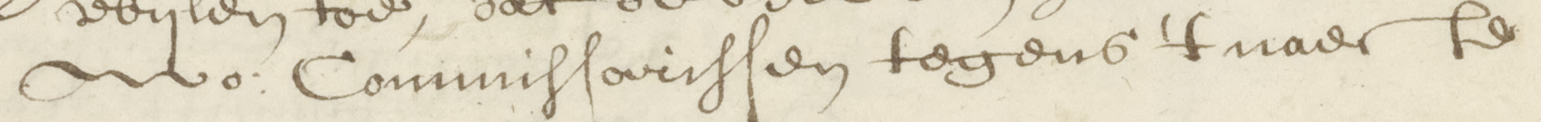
Mo: Commissarissen tegens ‛t naeste
